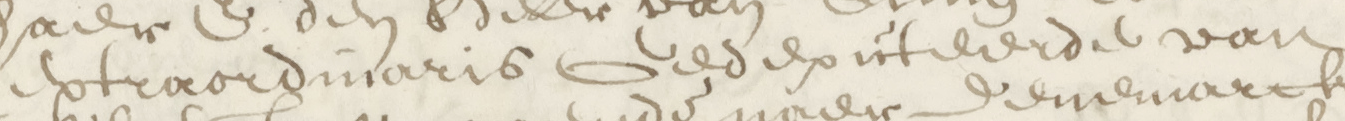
Extraordinaris Gedeputeerde van
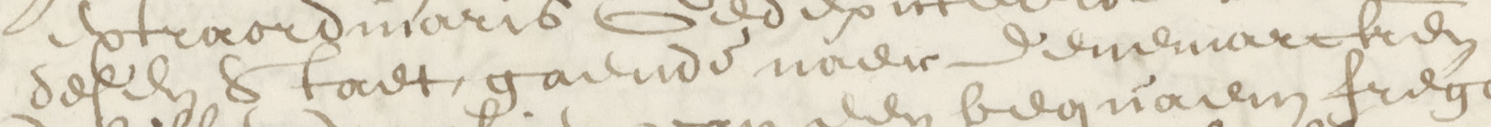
desen Staet, gaende naer Denemarcken
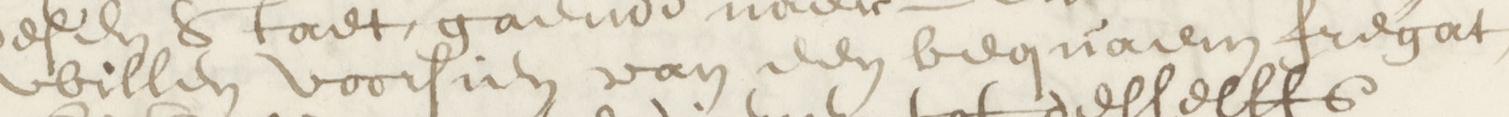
willen voorsien van een bequaem fregat,
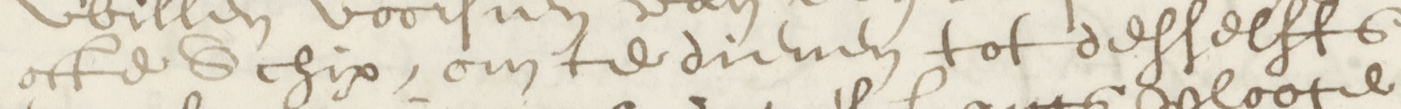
ofte Schip, om te dienen tot desselffs
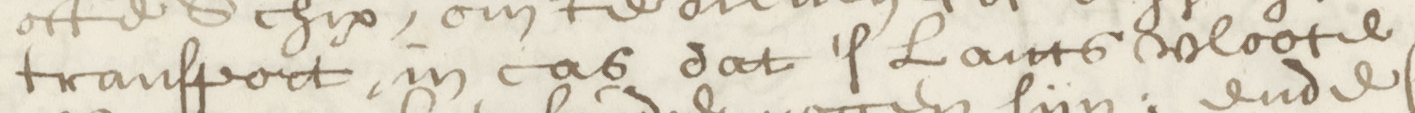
transport, in cas dat ‛s Lants Vloote
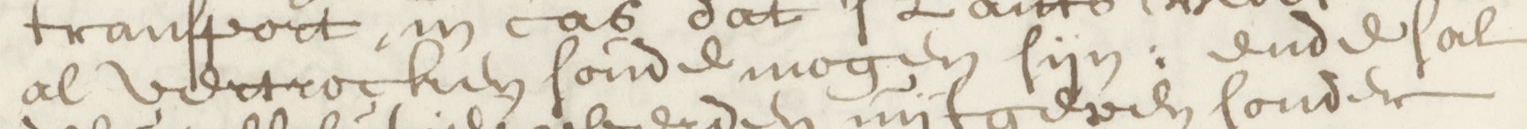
al vertrocken soude mogen sijn: ende sal
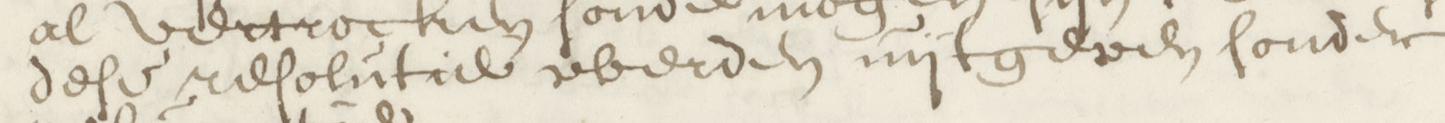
dese resolutie werden uijtgeven sonder
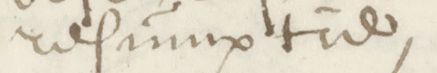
resumptie.
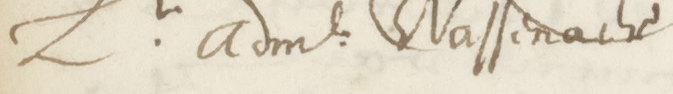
Lt. Admt. Wassenaer
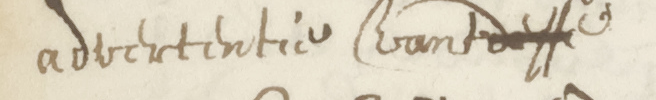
advertentie vant desse
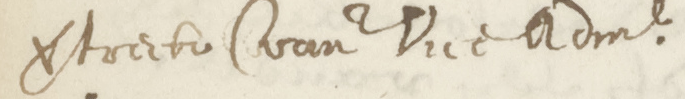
vtreck van Vice Admt.
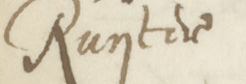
Ruijter
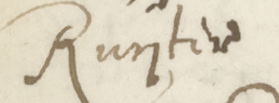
Ruijter
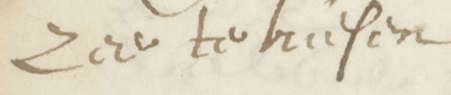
Zee te kiesen
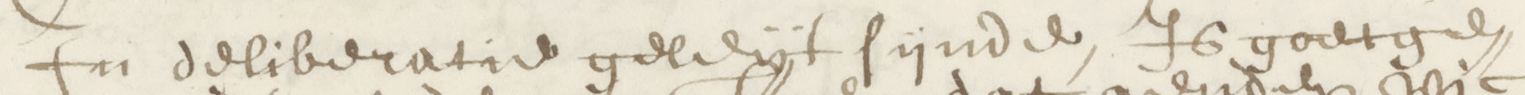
In deliberatie geleijt sijnde, Is goetge„
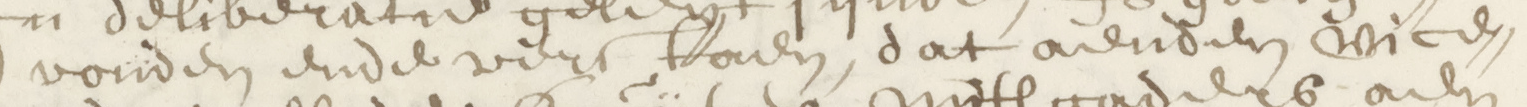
vonden ende verstaen, dat aenden Vice„
